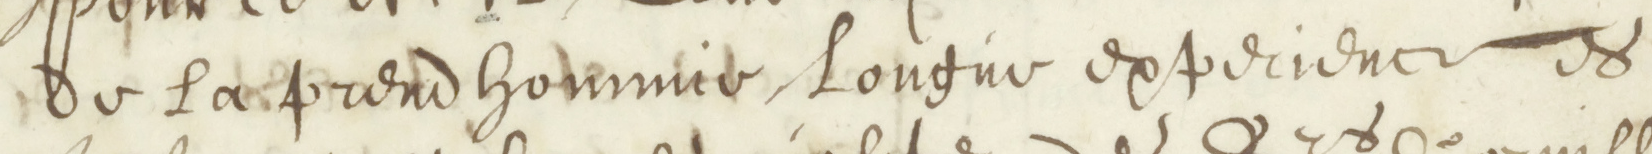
de la preudhommie, longue experiences
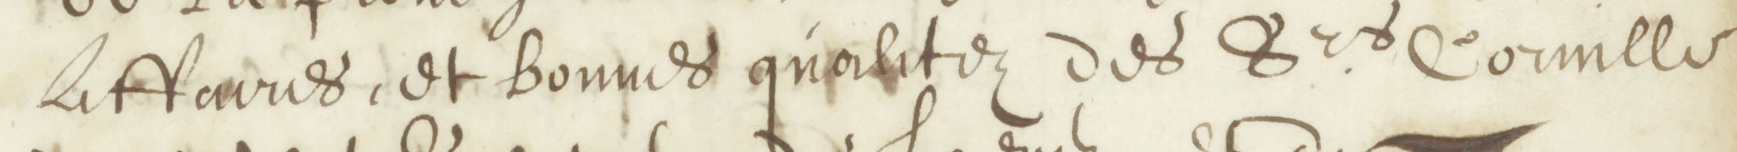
affaires, et bonnes qualitez des Srs. Cornille
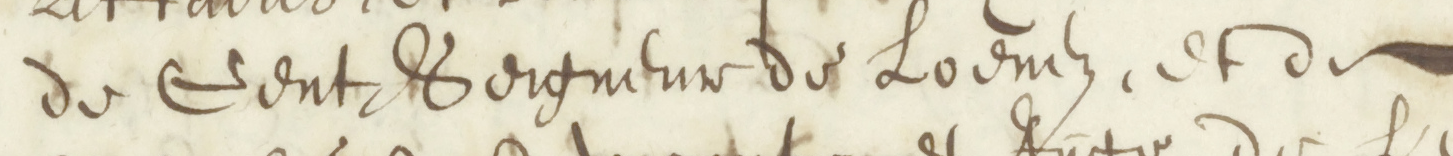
de Gent, Seigneur de Loenen, et de
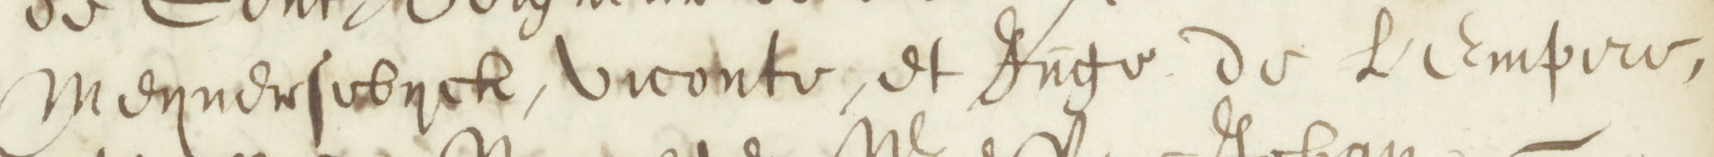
Meynerswyck, viconte, et Juge de l‛Empire,
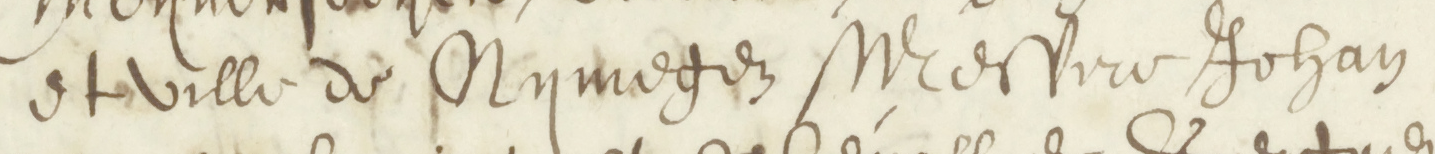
et ville de Nymegen Messire Johan
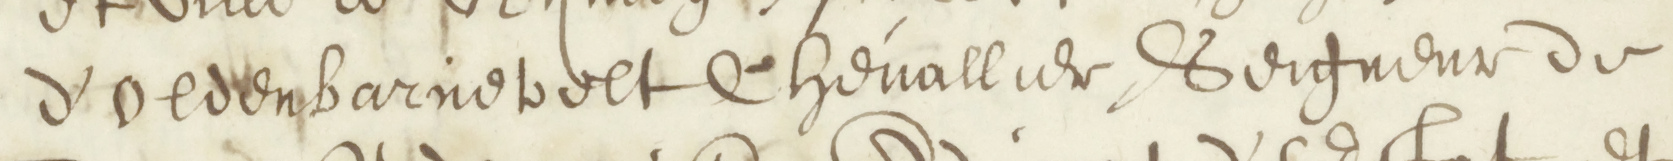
d'Oldenbarnevelt Cheuallier, Seigneur de
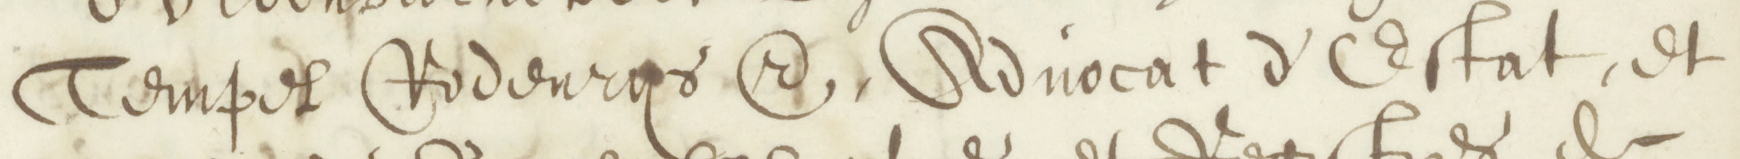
Tempel Rodenrys @, Aduocat d'Estat, et
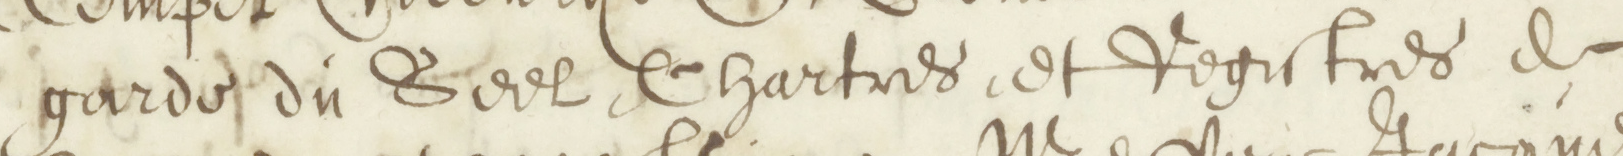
garde du Seel Chartres, et Registres de
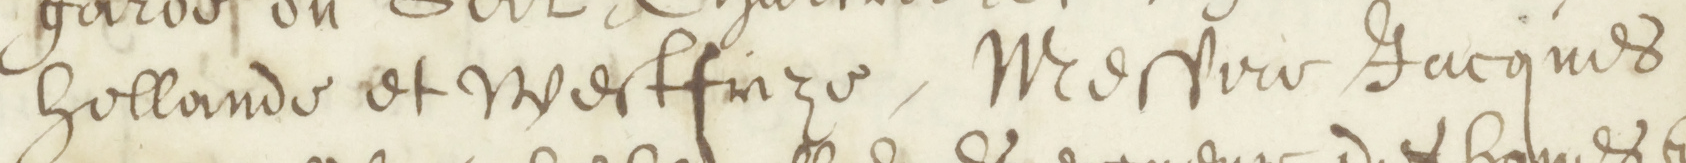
hollande et Westfrize, Messire Jacques
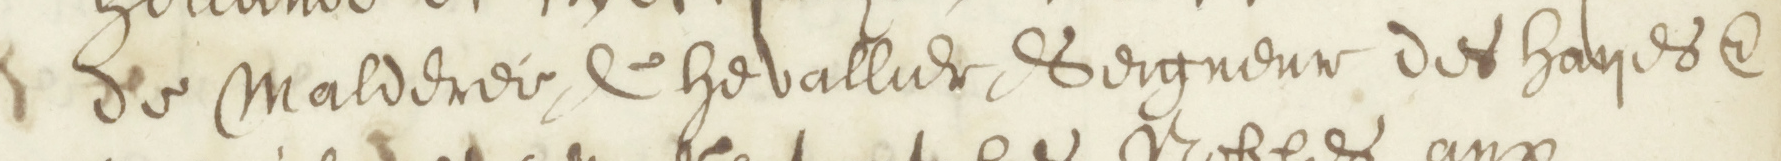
de Malderér Chevallier Seigneur des hayes @
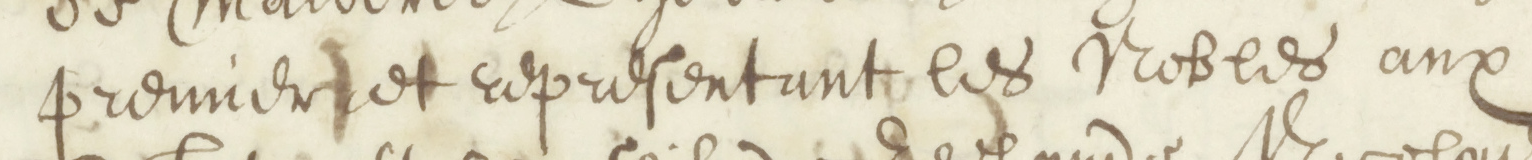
premier et representant les Nobles aux
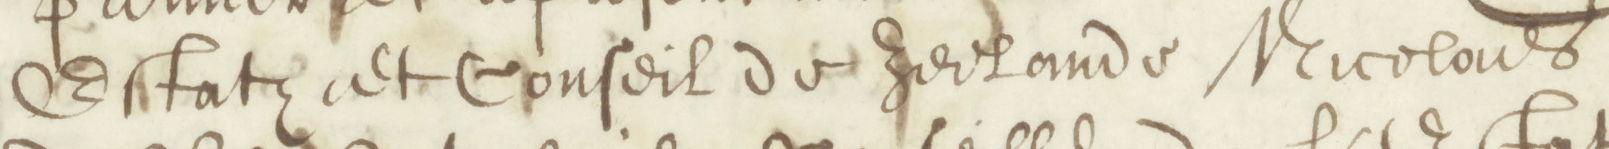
Estatz, et Conseil de Zeelande Nicolaes
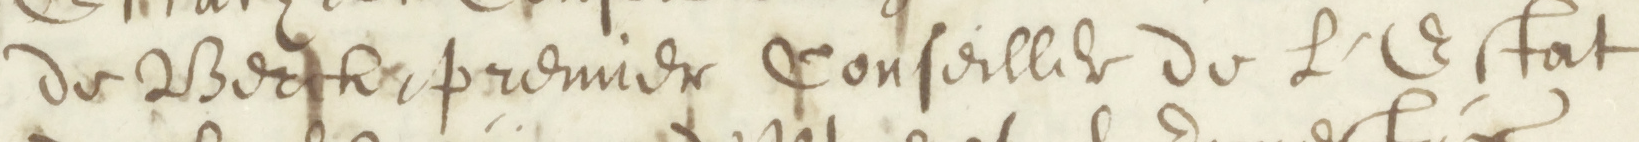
de Berck premier Conseiller de L‛Estat
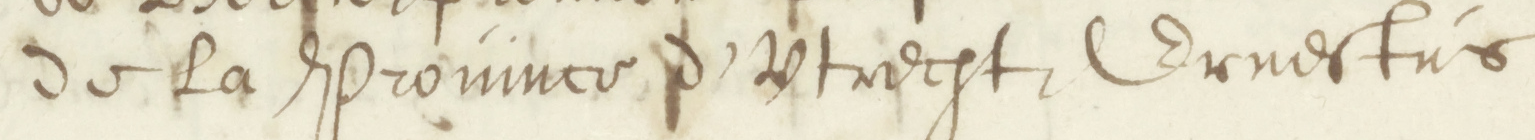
de la Prouince d‛ Utrecht, Ernestus
